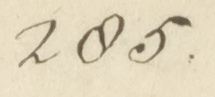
285.
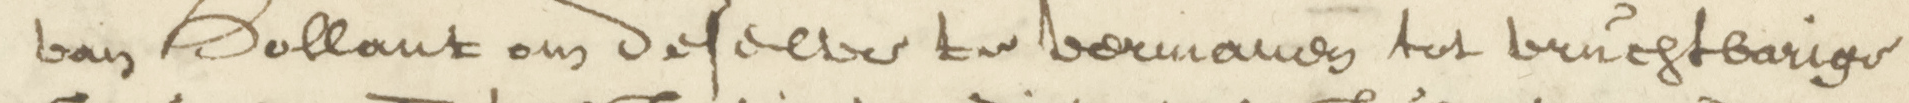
van Hollant om deselve te vermanen tot vruchtbarige
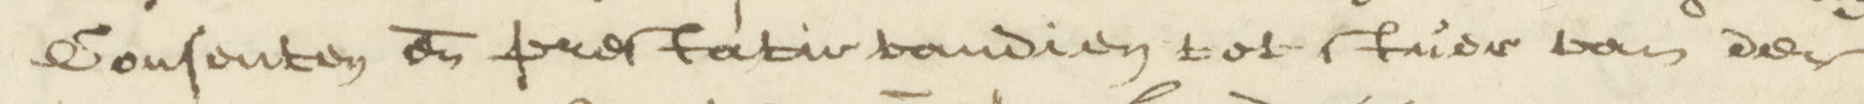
Consenten en prestatie vandien tot stuer van der
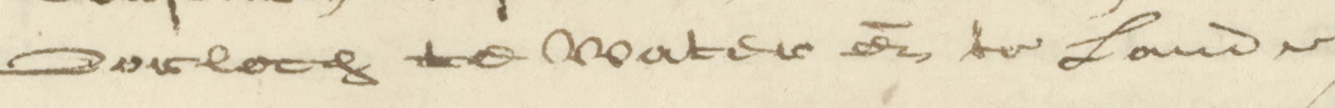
Oorloch te water en te Lande
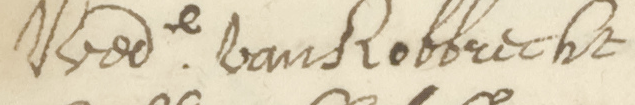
Wede. van Robbrecht
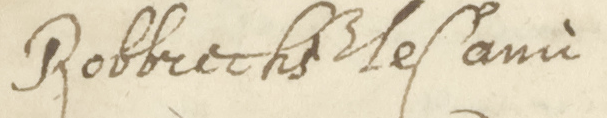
Robbrechs le Canu
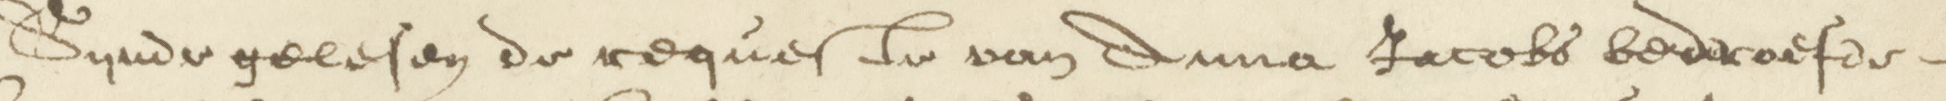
Synde gelesen de requeste van Anna Jacobs bedroefde -
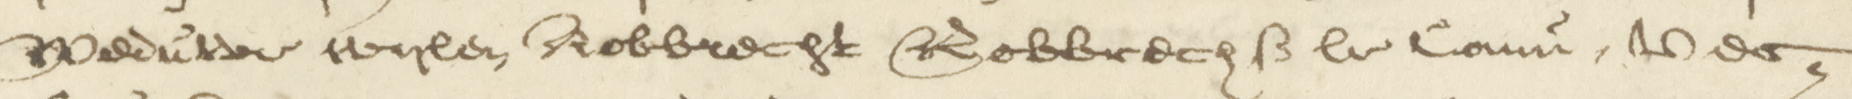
Weduwe wylen Robbrecht Robbrechts le Canu, Ver„
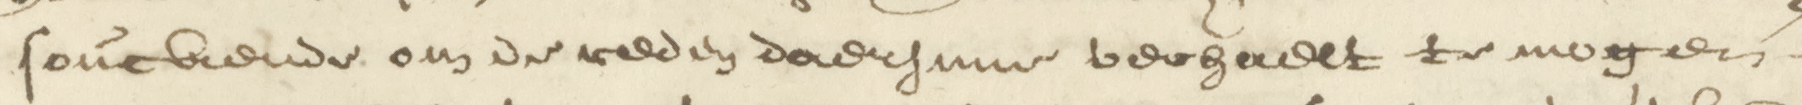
souckende om de reden daerinne verhaelt te mogen
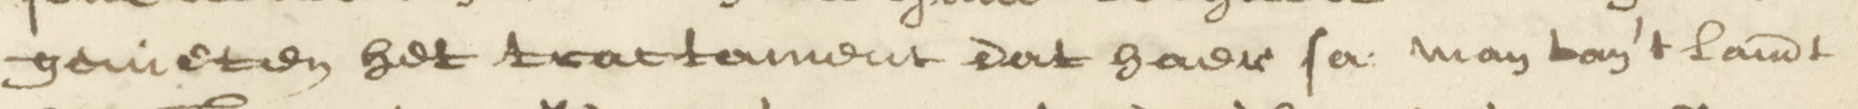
genieten het tractament dat haer sa. man van ‛t Landt
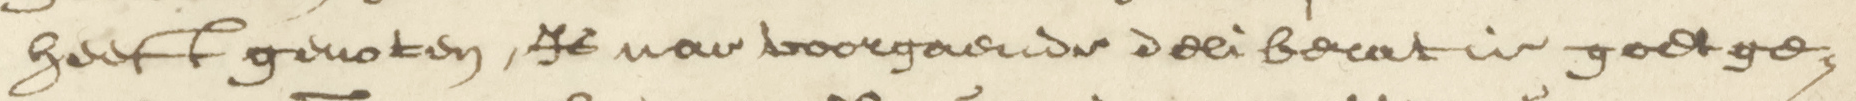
heeft genoten, Is nae voorgaende deliberatie goetge„
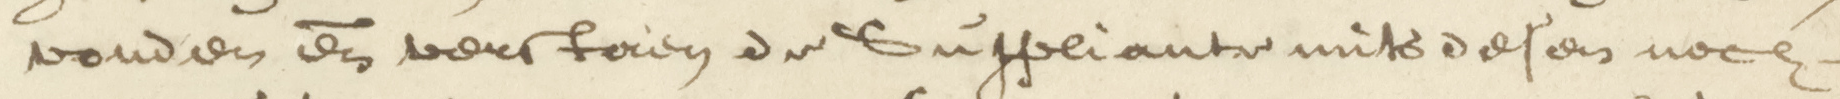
vonden en verstaen de Suppliante mits desen noch
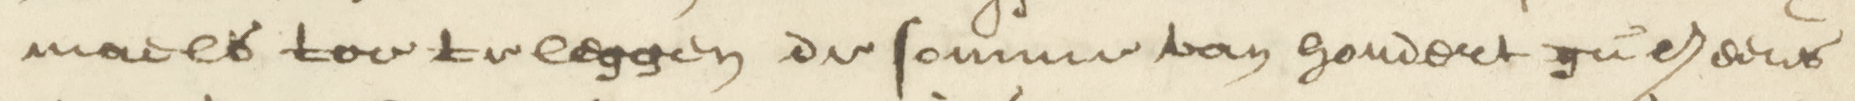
maels toe te leggen de somme van hondert gul eens
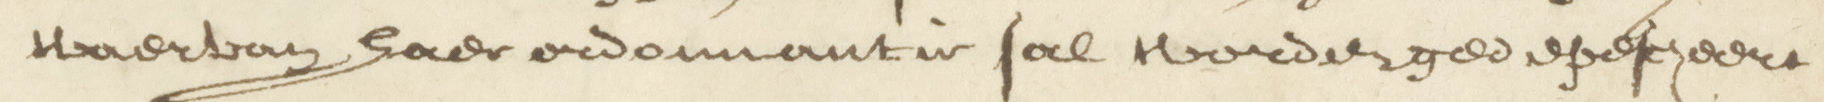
waervan haer ordonnantie sal worden gedepescheert
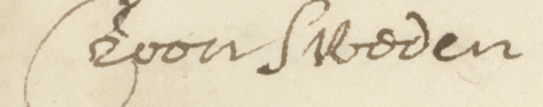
Croon Sweden
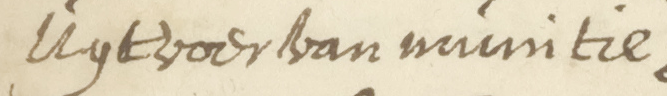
Uytvoer van munitie
